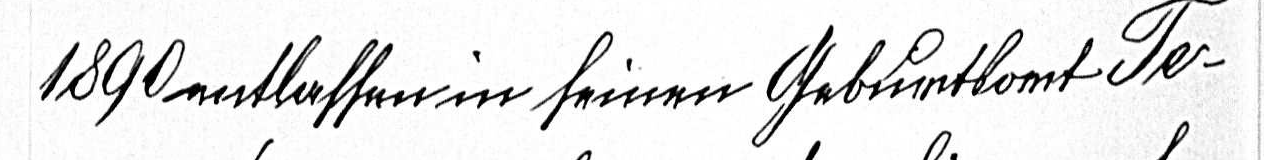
entlassen in seinen Geburtsort Te¬
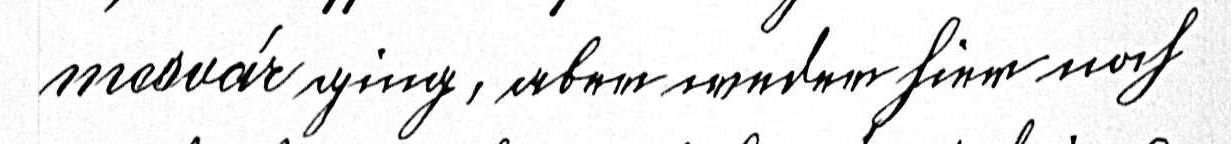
mesvár ging, aber weder hier noch
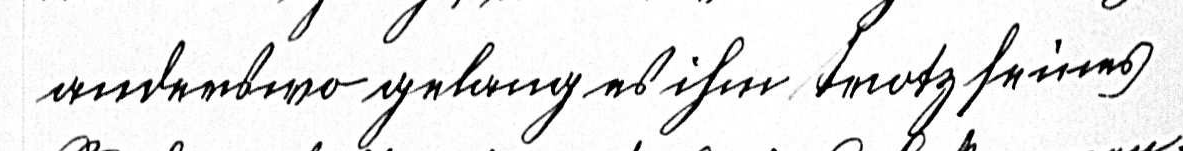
anderswo gelang es ihm trotz seines
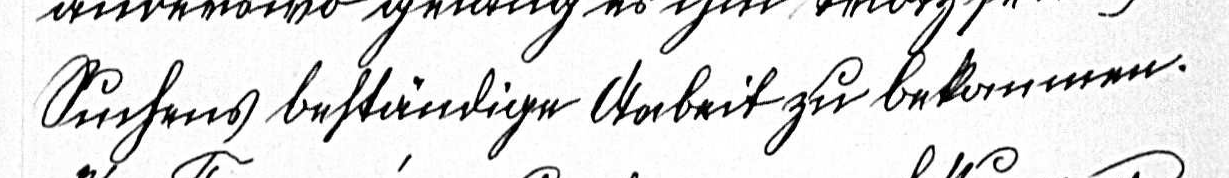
Suchens beständige Arbeit zu bekommen.
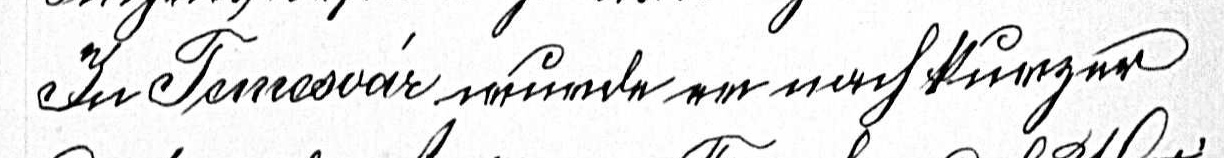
In Temesvár wurde er nach kurzer
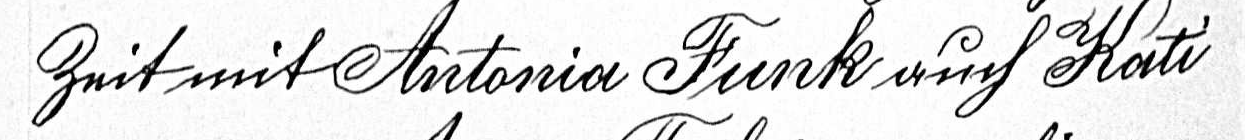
Zeit mit Antonia Funk auch Kati
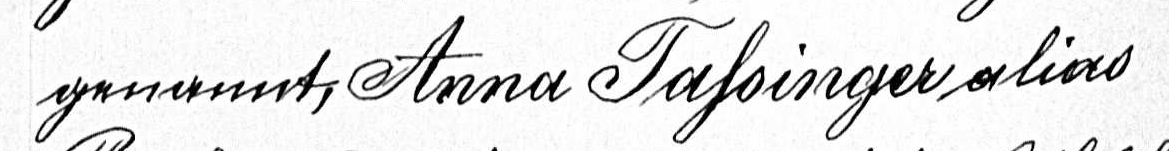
genannt, Anna Tassinger alias
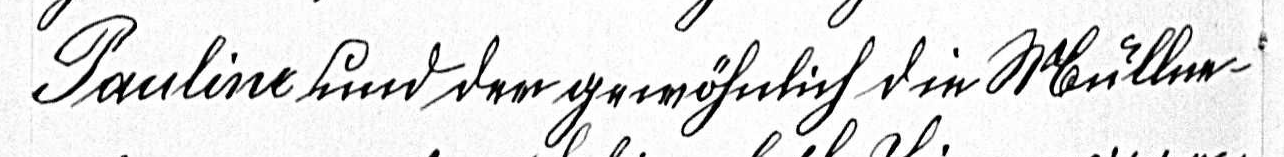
Pauline und der gewöhnlich die Müllne¬
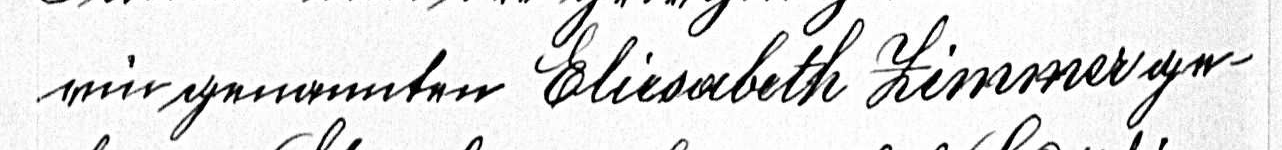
rin genannten Elisabeth Zimmer ge¬
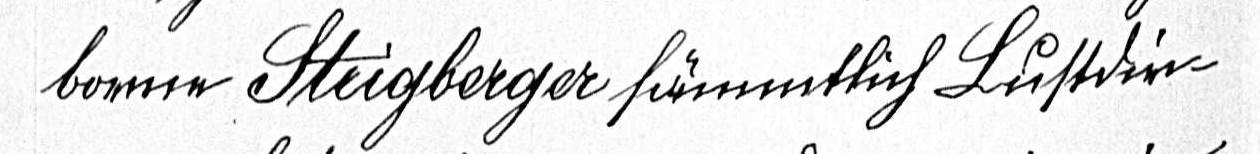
borene Steigberger sämmtlich Lustdir¬
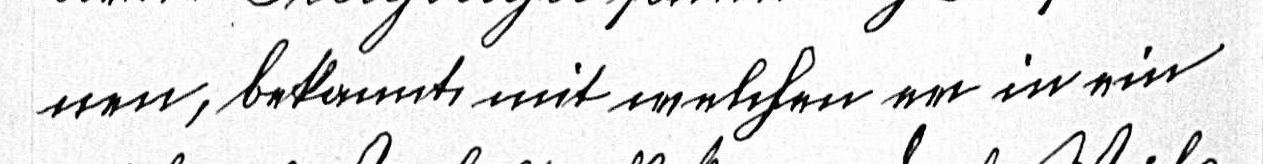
nen, bekannt, mit welchen er in ein
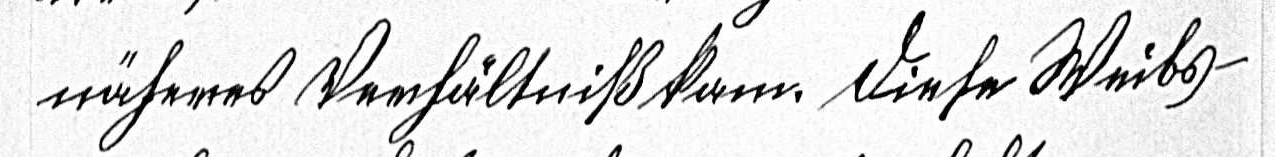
näheres Verhältniß kam. Diese Weibs¬
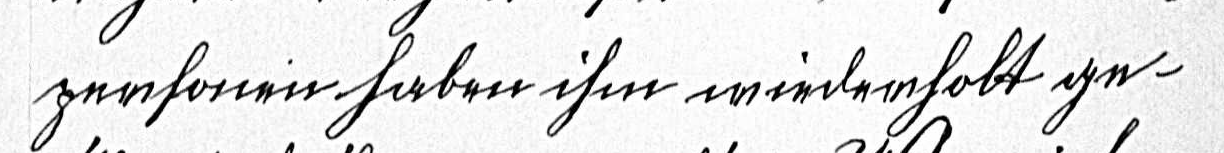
personen haben ihm wiederholt ge¬
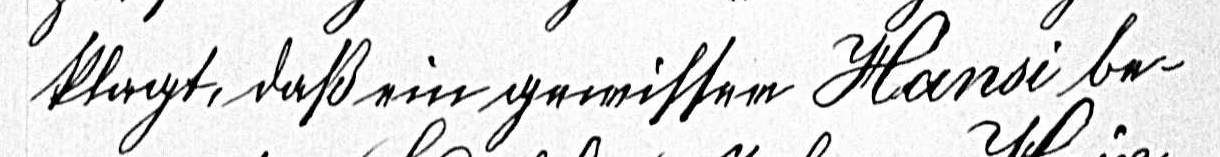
klagt, daß ein gewisser Hansi be¬
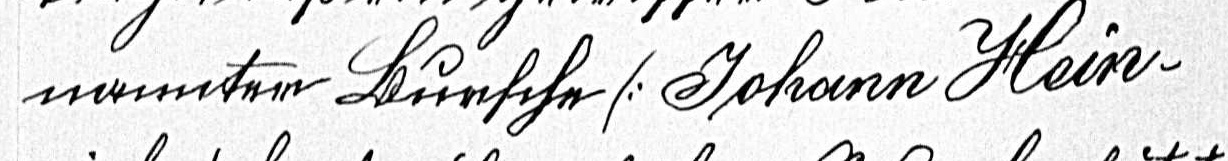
nannter Bursche (Johann Hein¬
